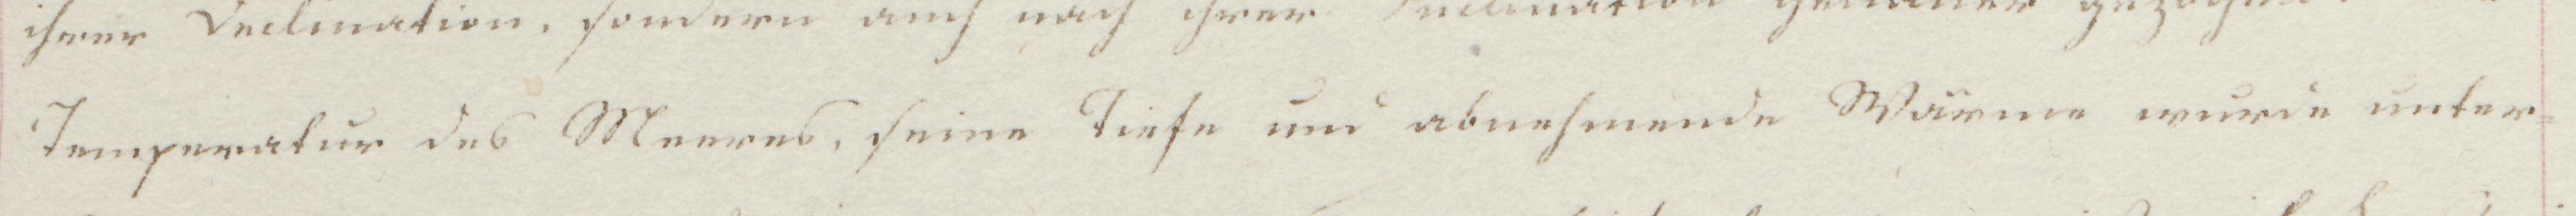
Temperatur des Meeres, seine Tiefe und abnehmende Wärme wurde unter-
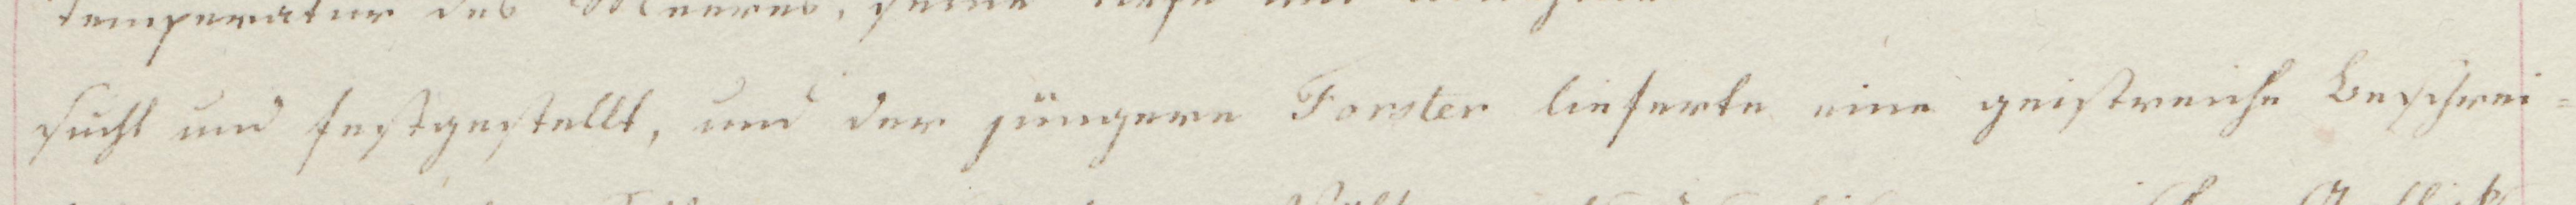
sucht und festgestellt, und der jüngere Forster lieferte eine geistreiche Beschrei-
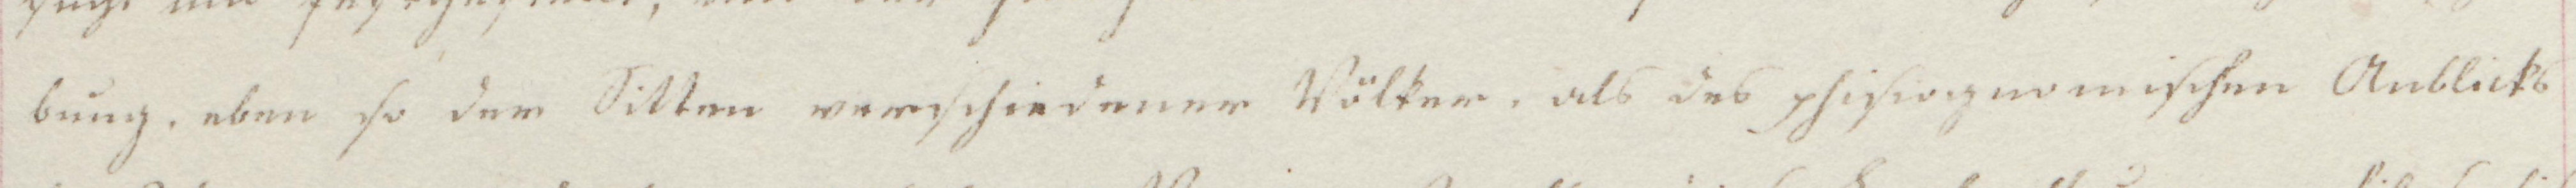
bung, eben so der Sitten verschiedener Völker, als des phisiognomischen Anblicks
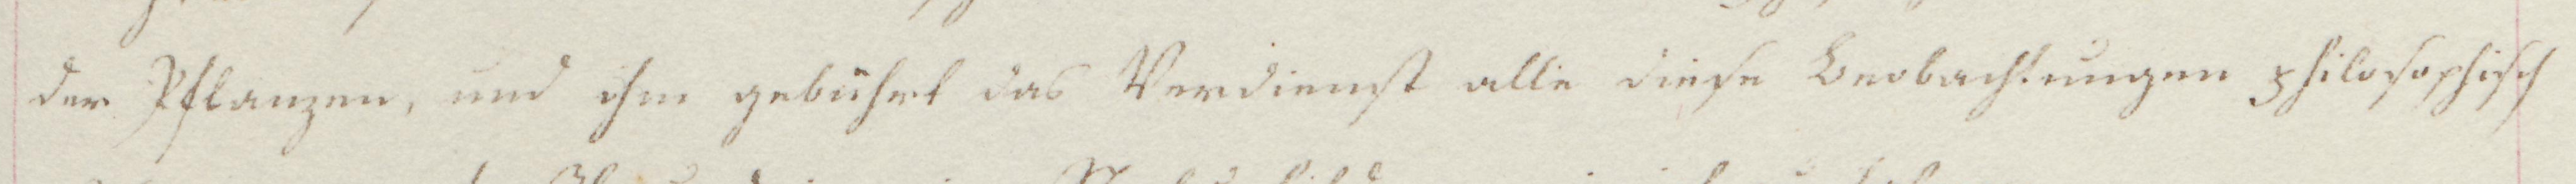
der Pflanzen, und ihm gebührt das Verdienst alle diese Beobachtungen philosophisch
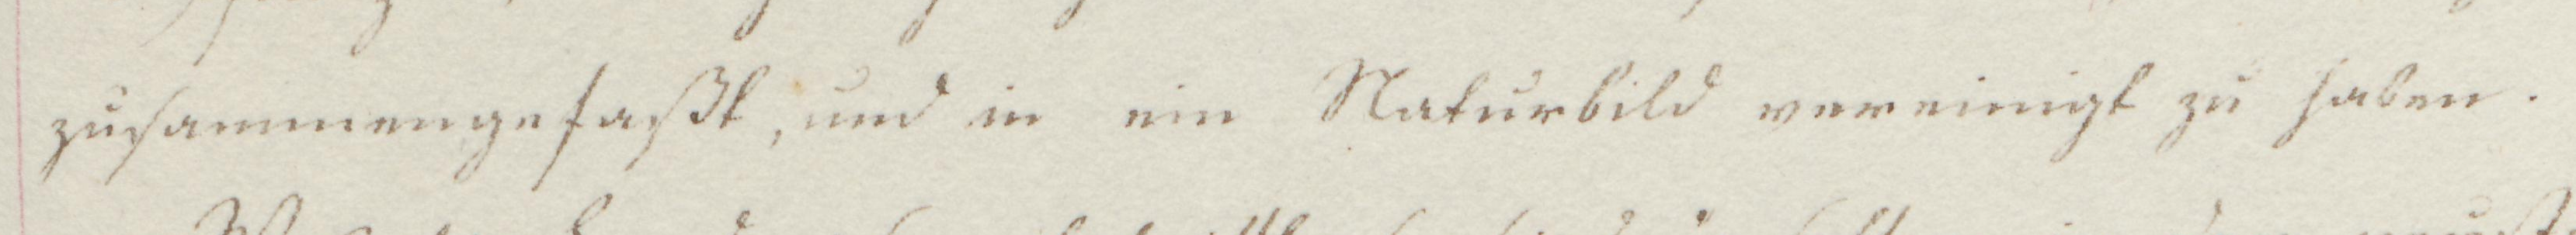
zusammengefaßt, und in ein Naturbild vereinigt zu haben.
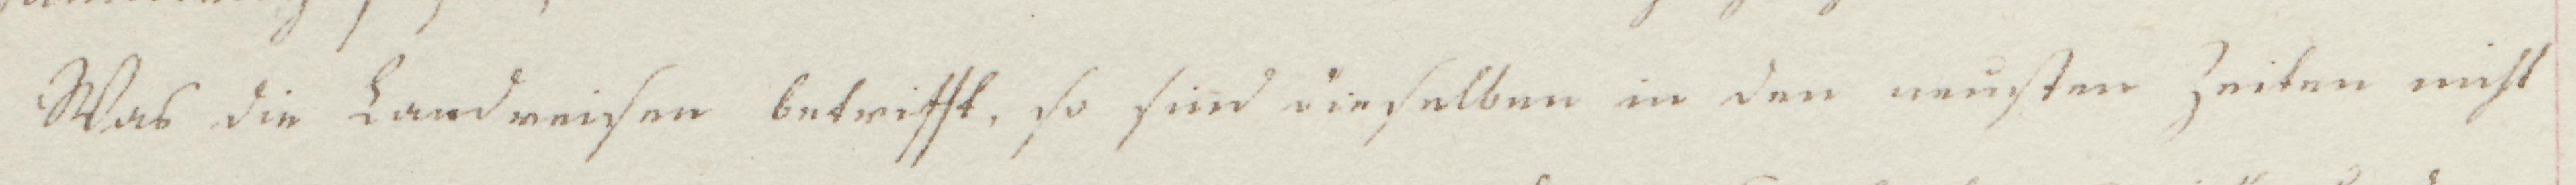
Was die Landreisen betrifft, so sind dieselben in den neusten Zeiten nicht
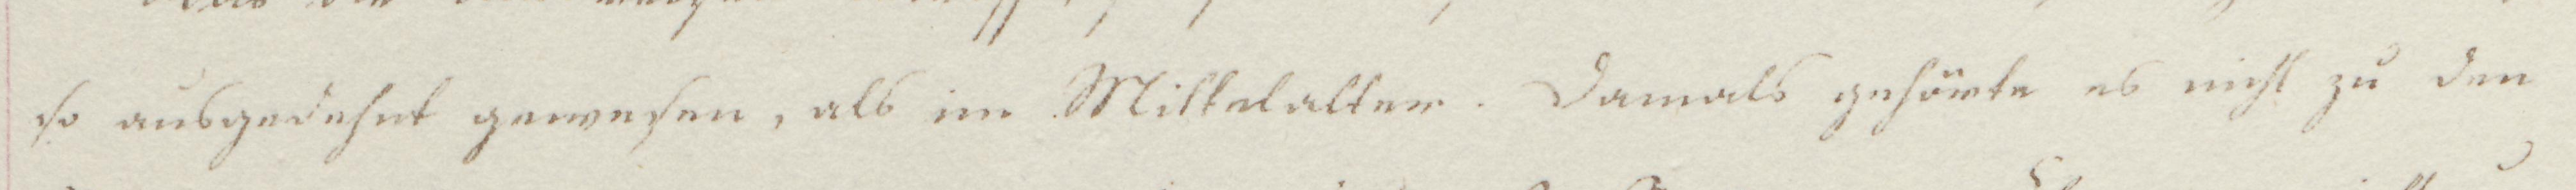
so ausgedehnt gewesen, als im Mittelalter. Damals gehörte es nicht zu den
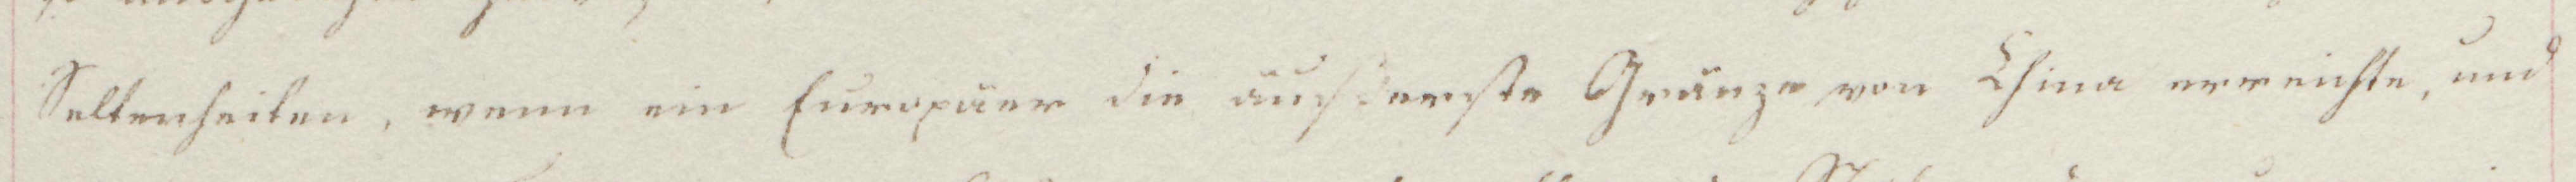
Seltenheiten, wenn ein Europäer die äußerste Gränze von China erreichte, und
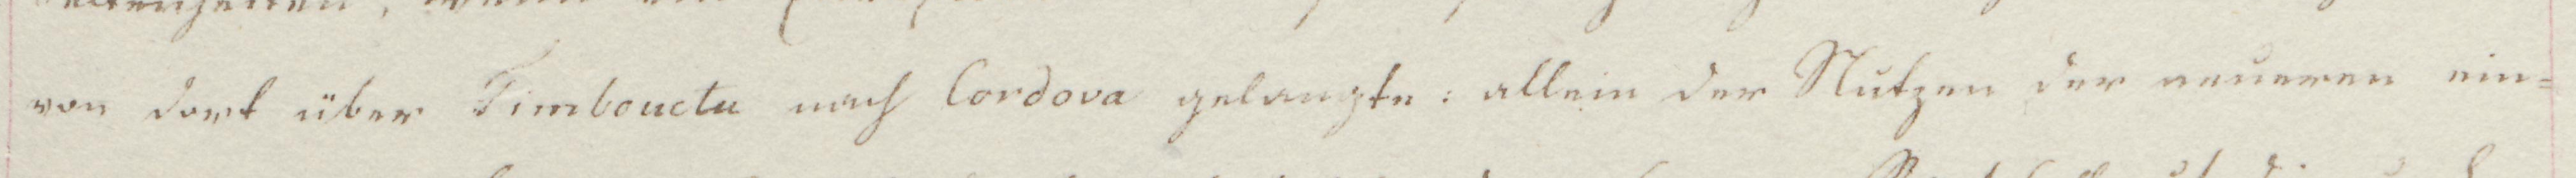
von dort über Timbouctu nach Cordova gelangte: allein der Nutzen der neueren ein-
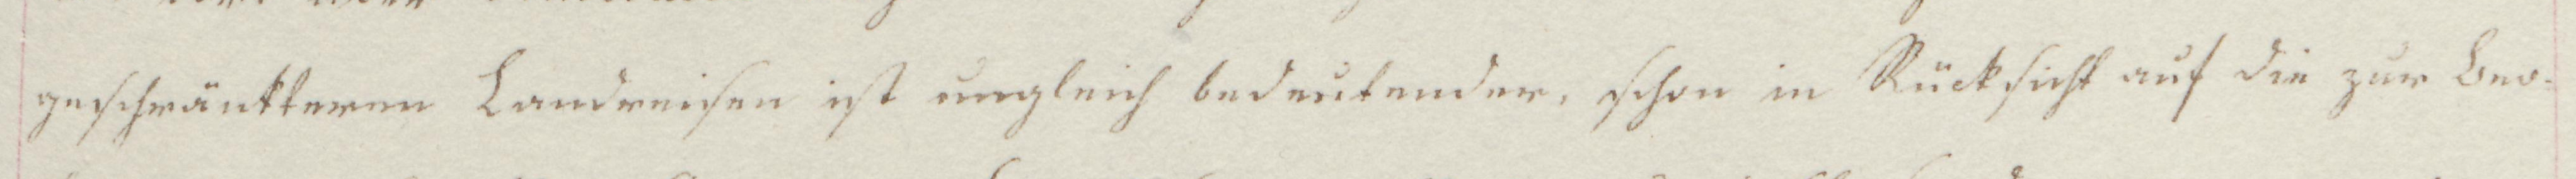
geschränkteren Landreisen ist ungleich bedeutender, schon in Rücksicht auf die zur Beo-
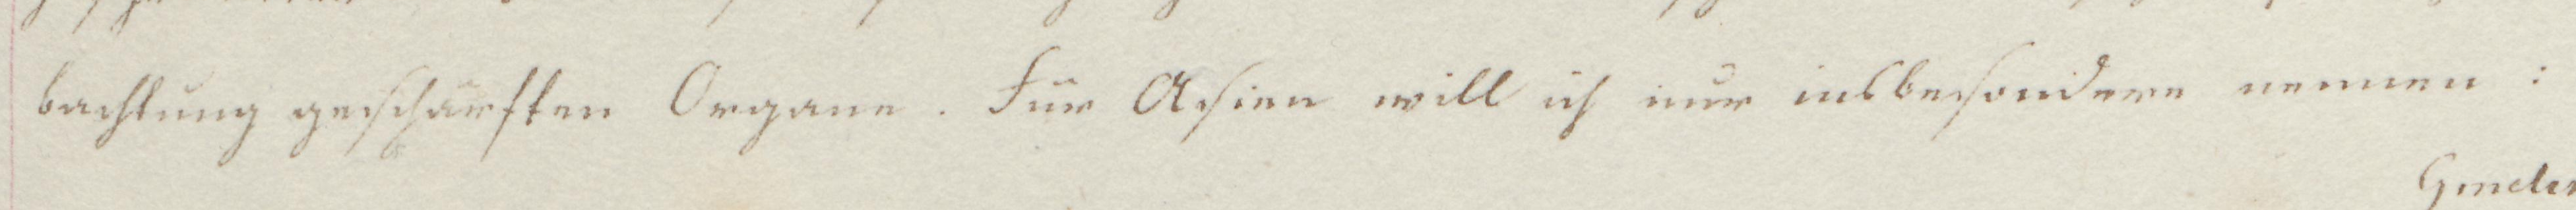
bachtung geschärften Organe. Für Asien will ich nur insbesondere nennen:
